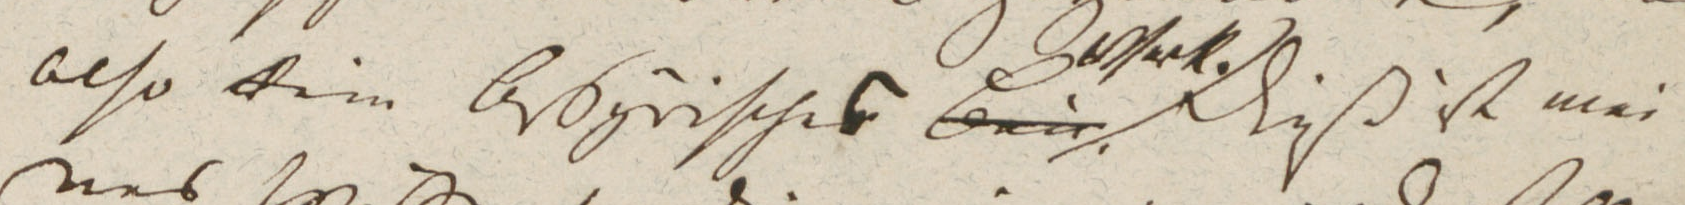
also kein Assyrischers BauWerk.. Diess ist mei-
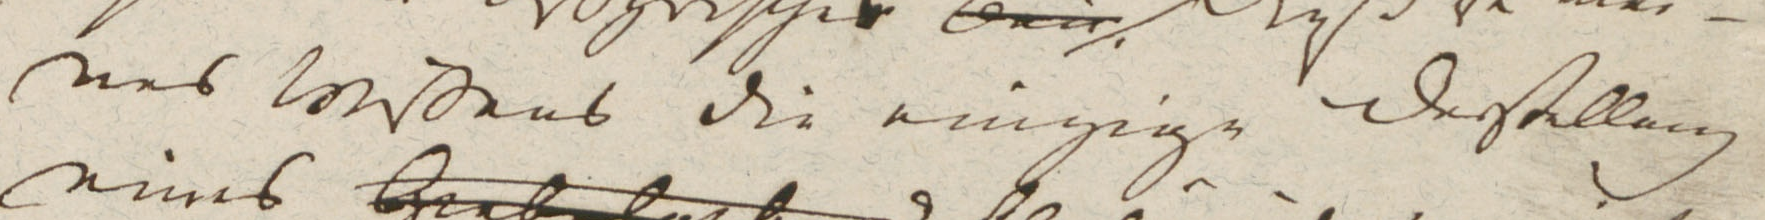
nes Wissens die einzige Darstellung
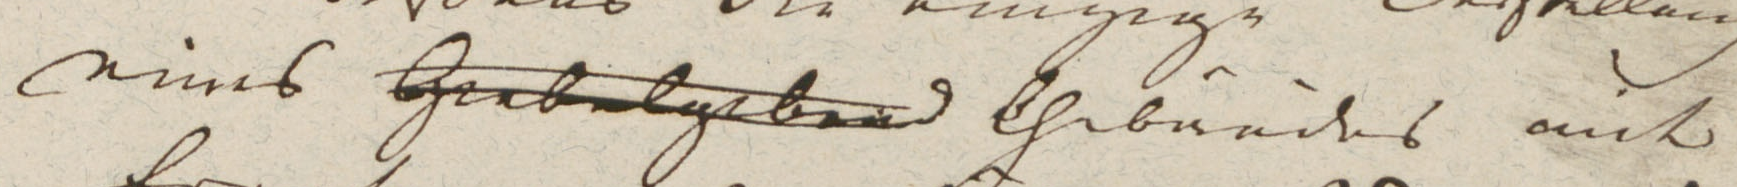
eines Giebelgebaud Gebäudes mit
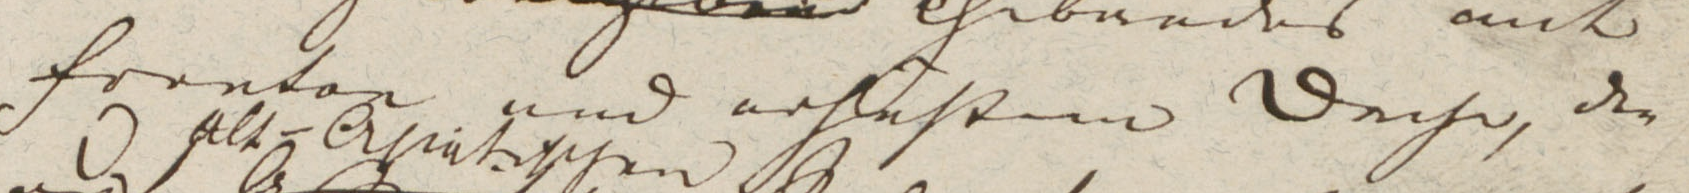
Fronten und erhöhtem Dache, die
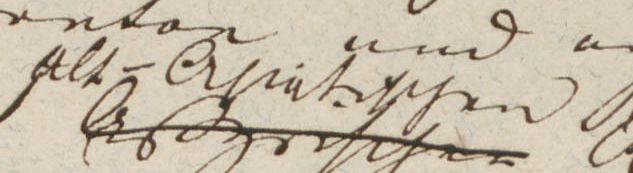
Alt-Asiatischen
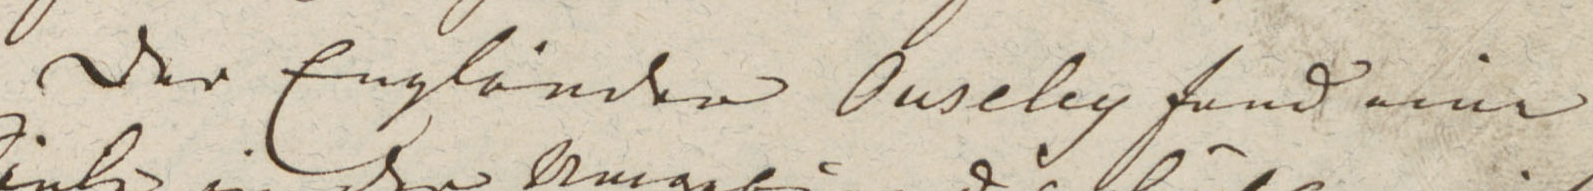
Der Engländer Ouseley fand eine
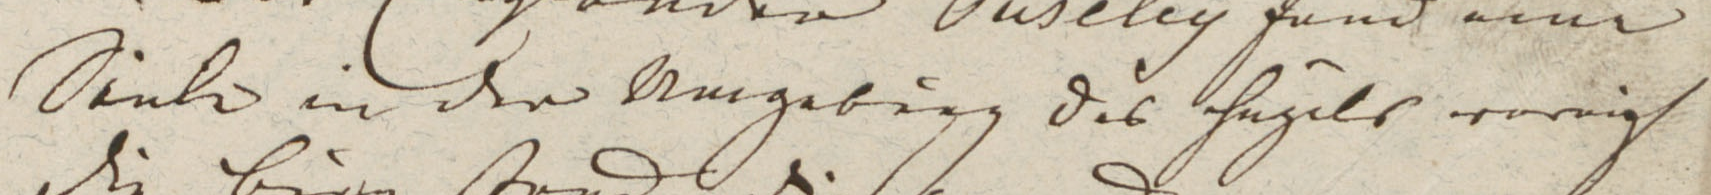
Säule in der Umgebung des Hügels worauf
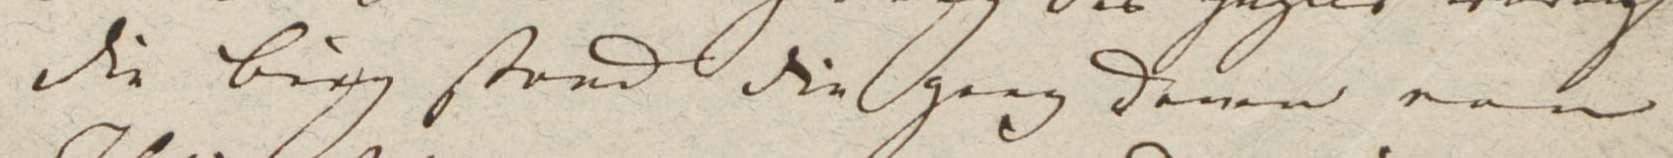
die Burg stand die ganz denen von
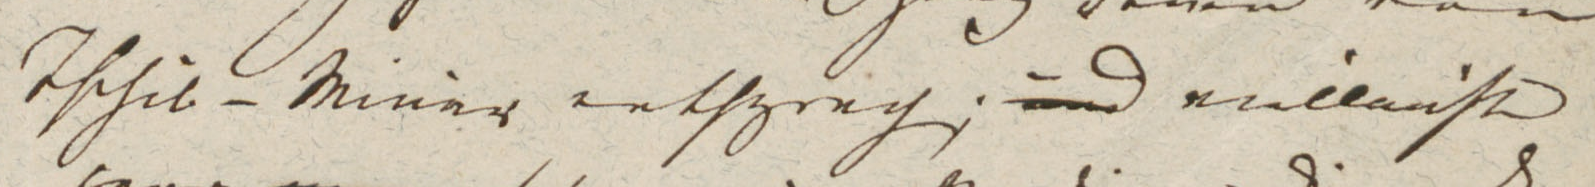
Tschil-Minar entsprach; und vielleicht
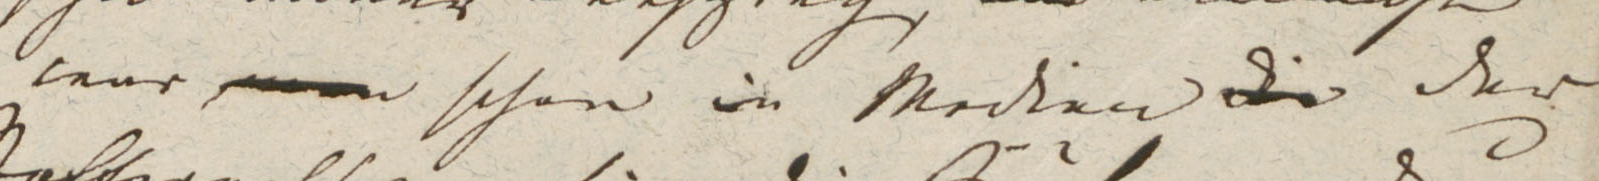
war man schon in Medien die der
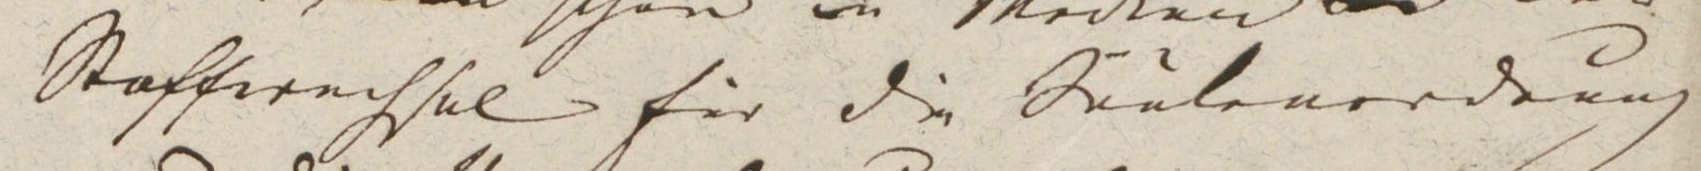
Stoffwechsel für die Säulenordnung
